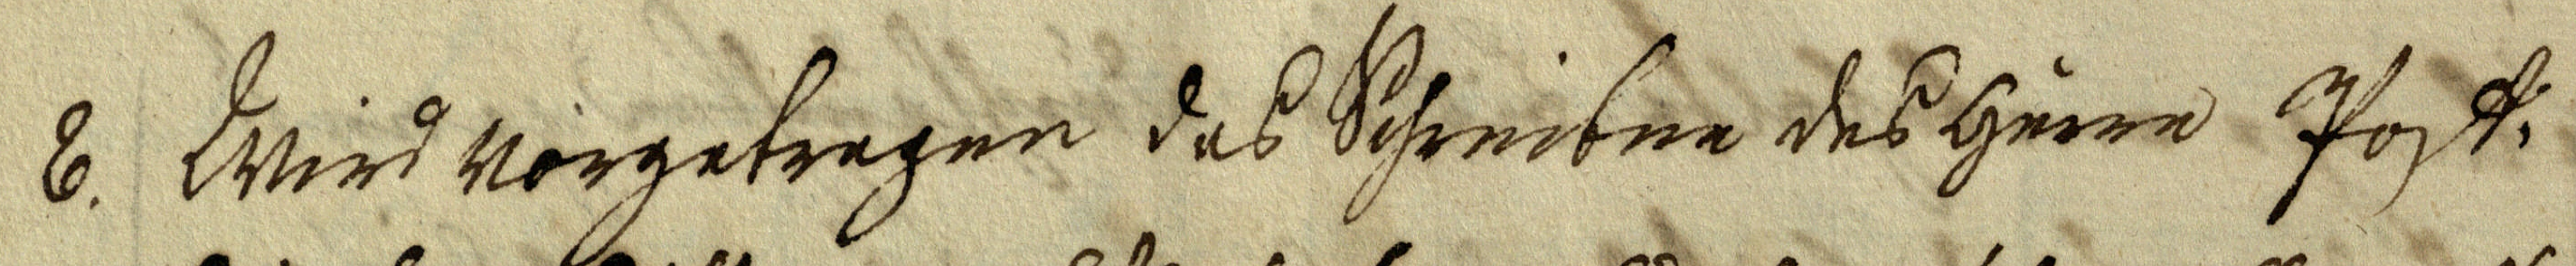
8. Wird vorgetragen das Schreiben des Herrn Post¬
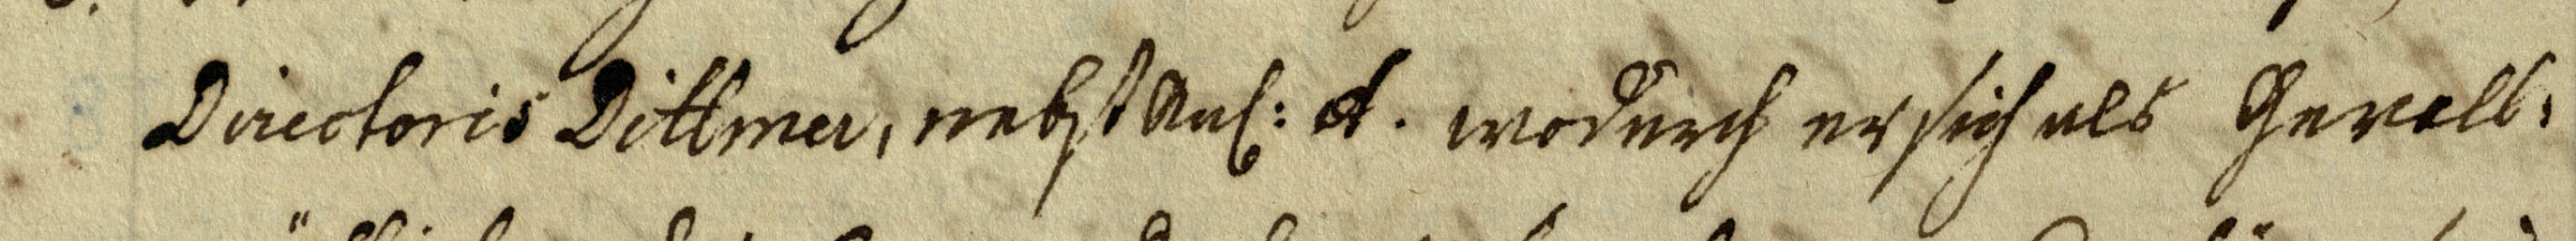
Directoris Dittmer, nebst Anl: d. wodurch Er sich als Gevoll¬
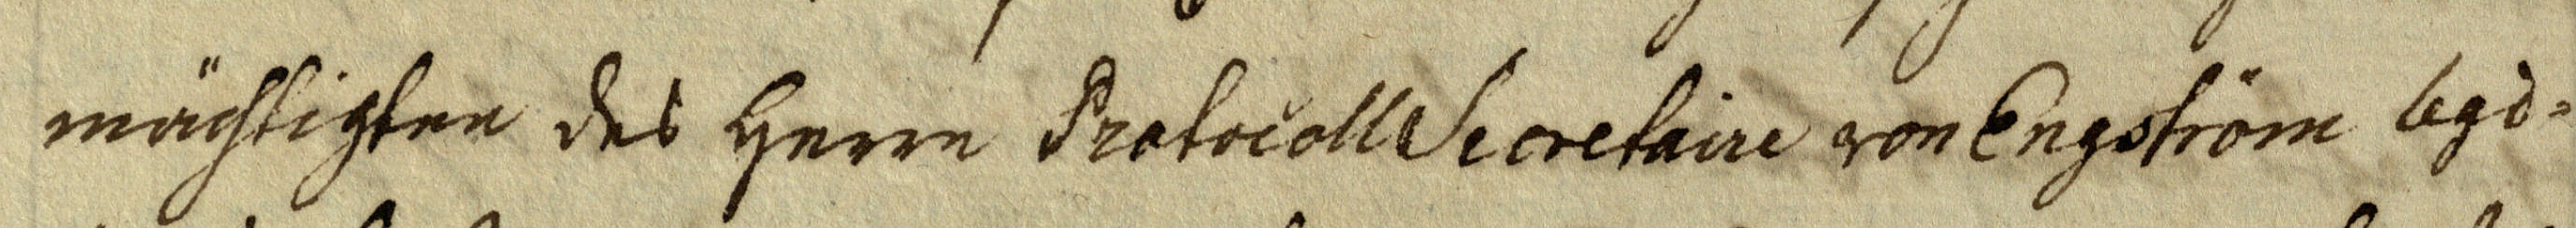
mächtigten des Herrn Protocoll Secretaire von Engström legi¬
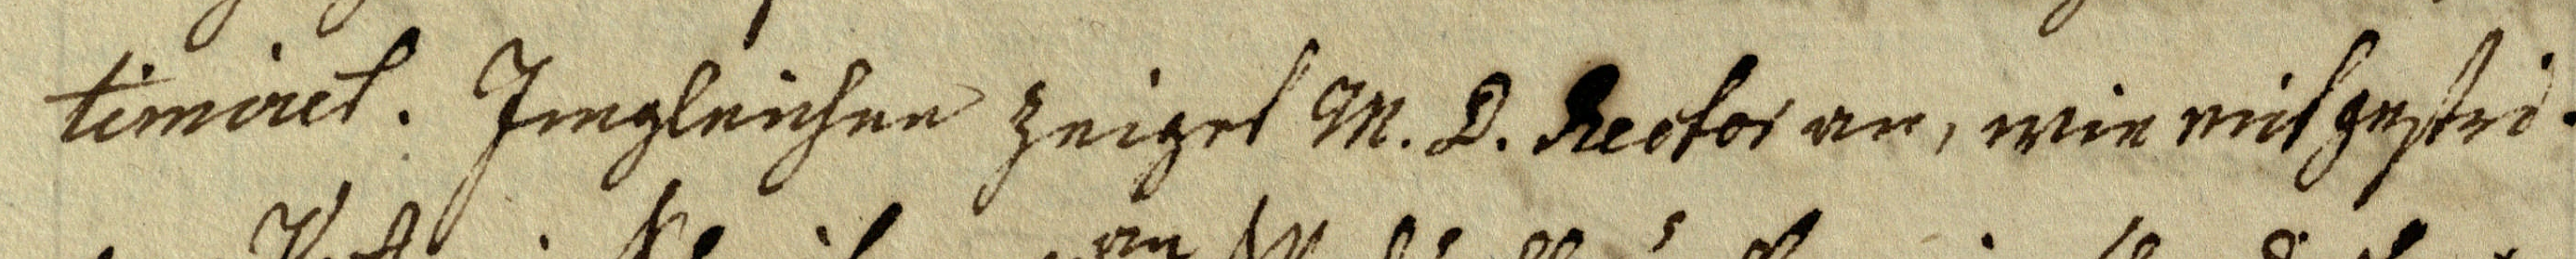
timiret. Imgleichen zeiget M. D. Rector an, wie mit gestri¬
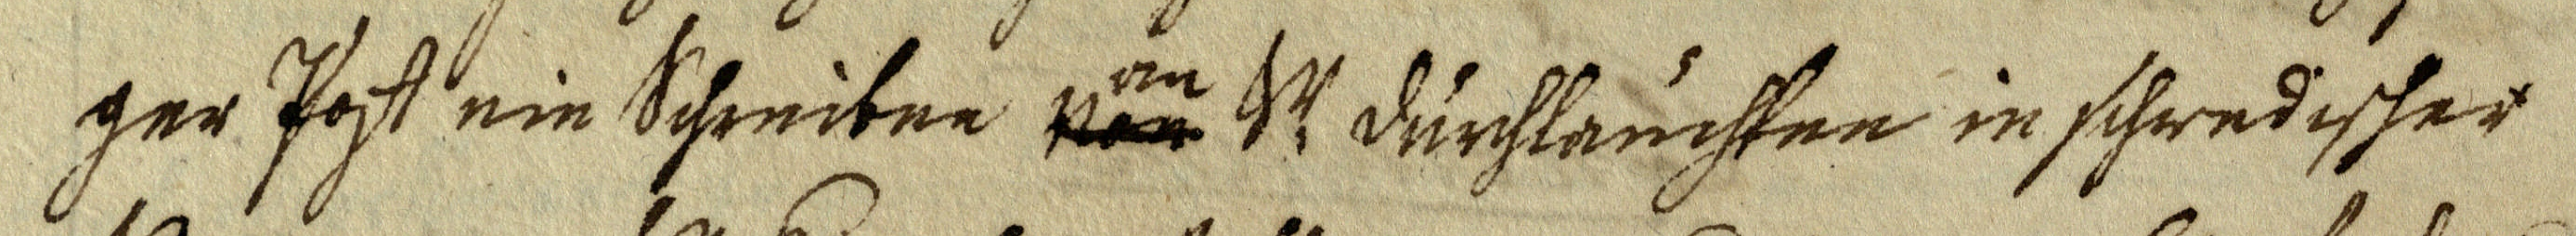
ger Post ein Schreiben von an Sr. Durchlauchten in schwedischer
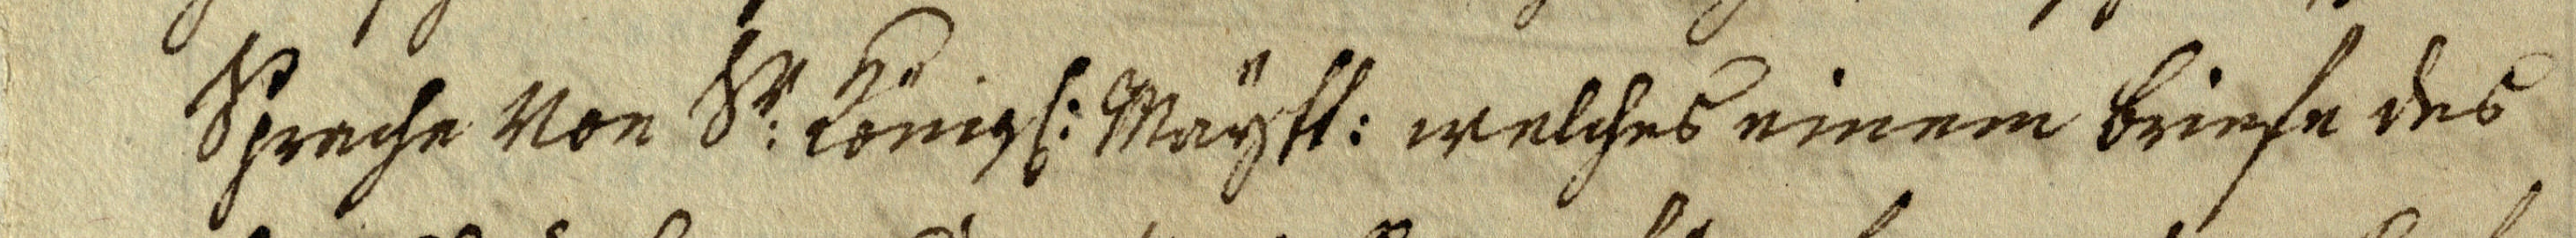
Sprache von Sr. Königl. Maÿtt. welches einem briefe des
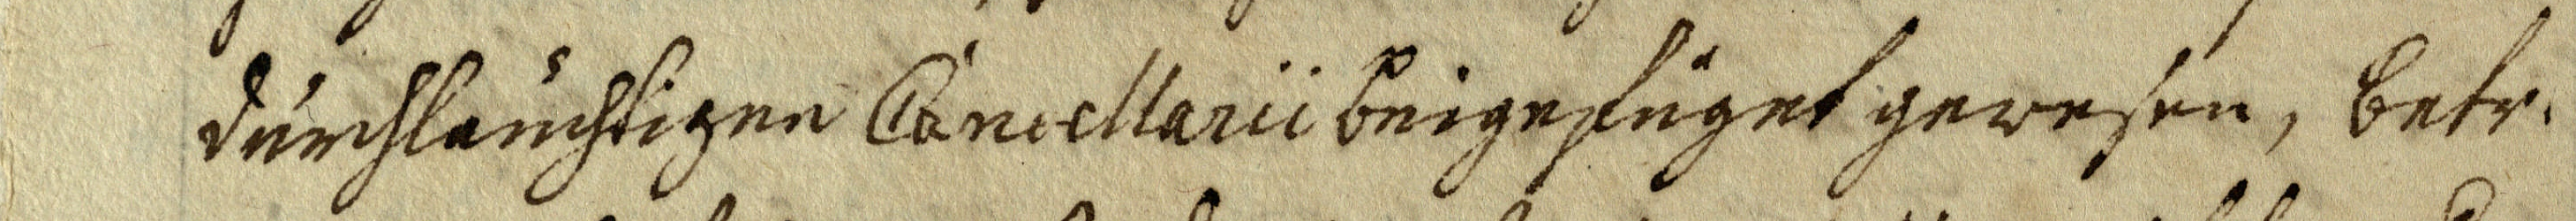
durchlauchtigen Cancellarii beigefüget gewesen, betr.
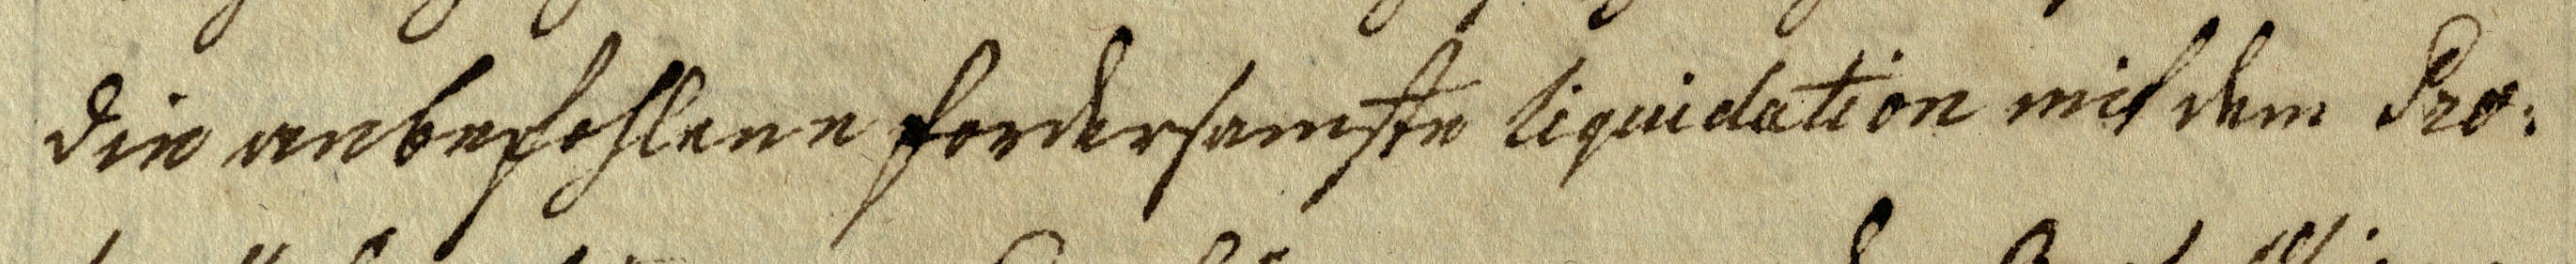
die anbefohlene fordersamste liquidation mit dem Pro¬
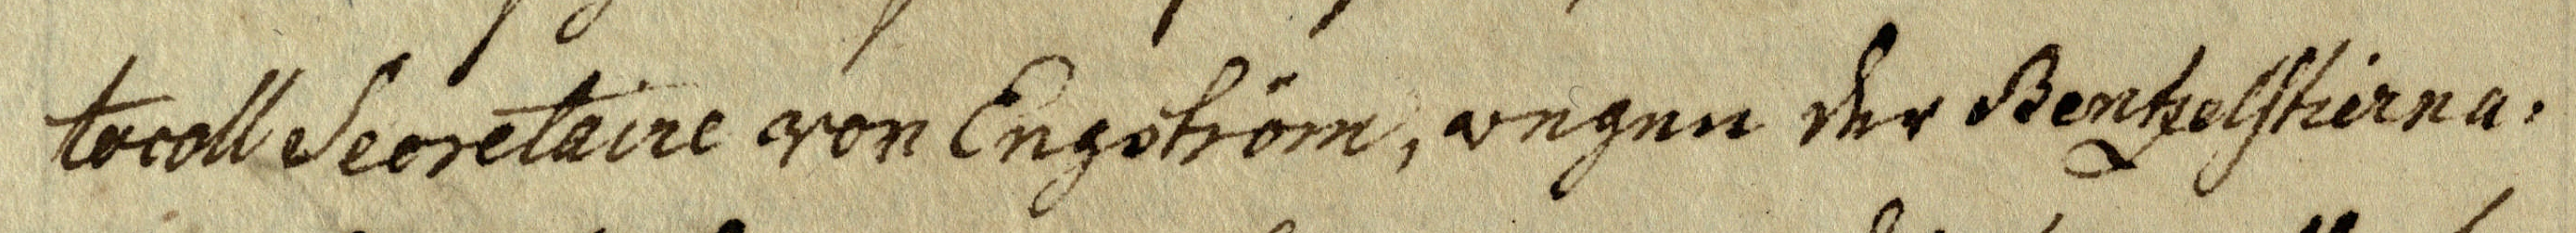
tocoll Secretaire von Engström, wegen der Bentzelstierna¬
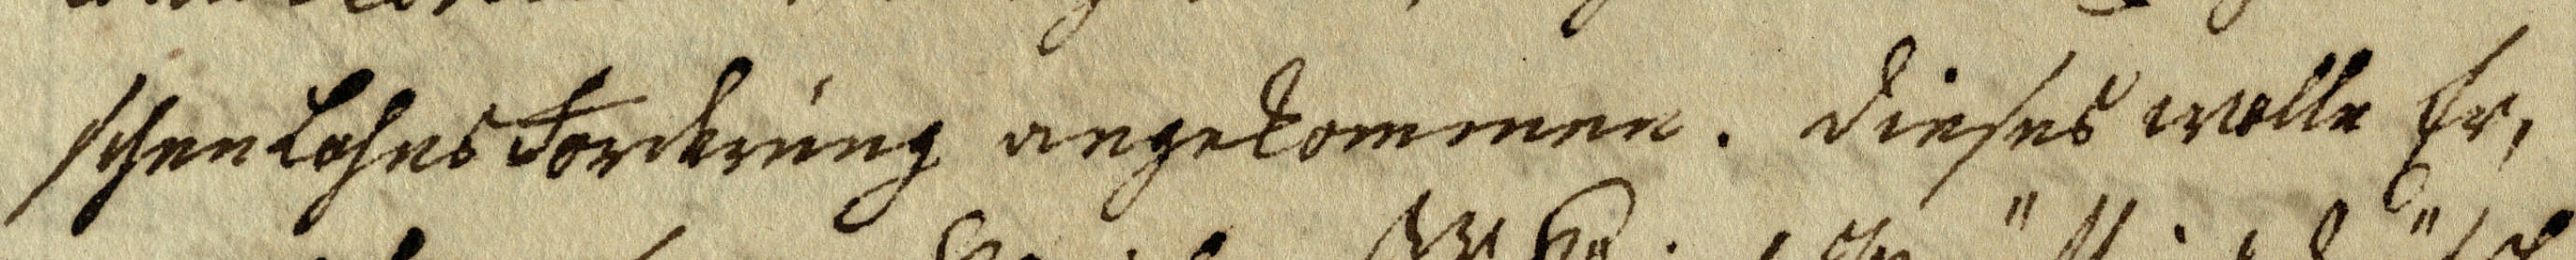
schen LohnsForderung angekommen. Dieses wolle Er,
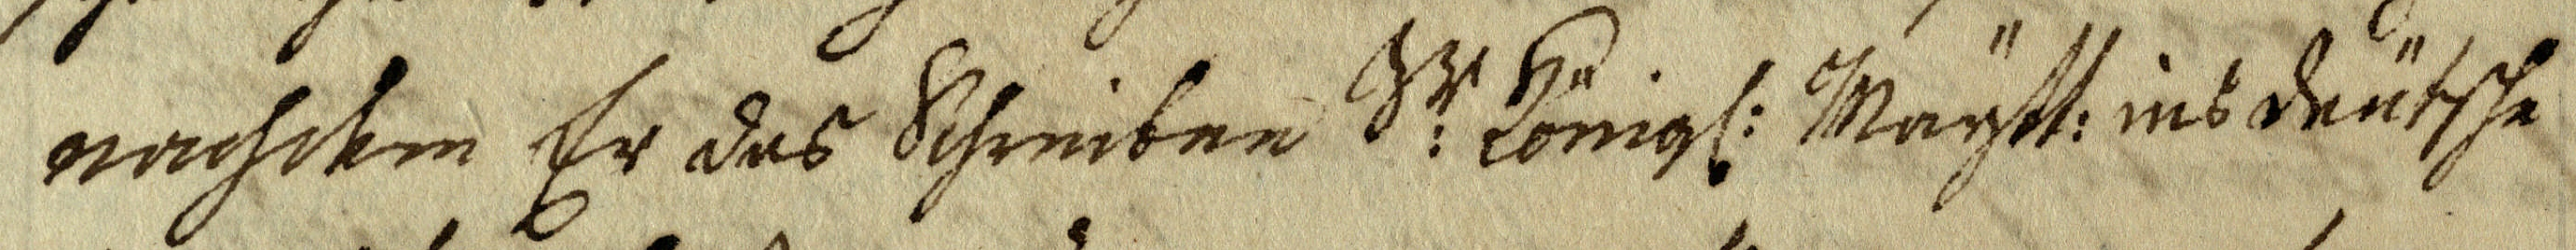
nachdem Er das Schreiben Sr. Königl. Maÿtt. ins deutsche
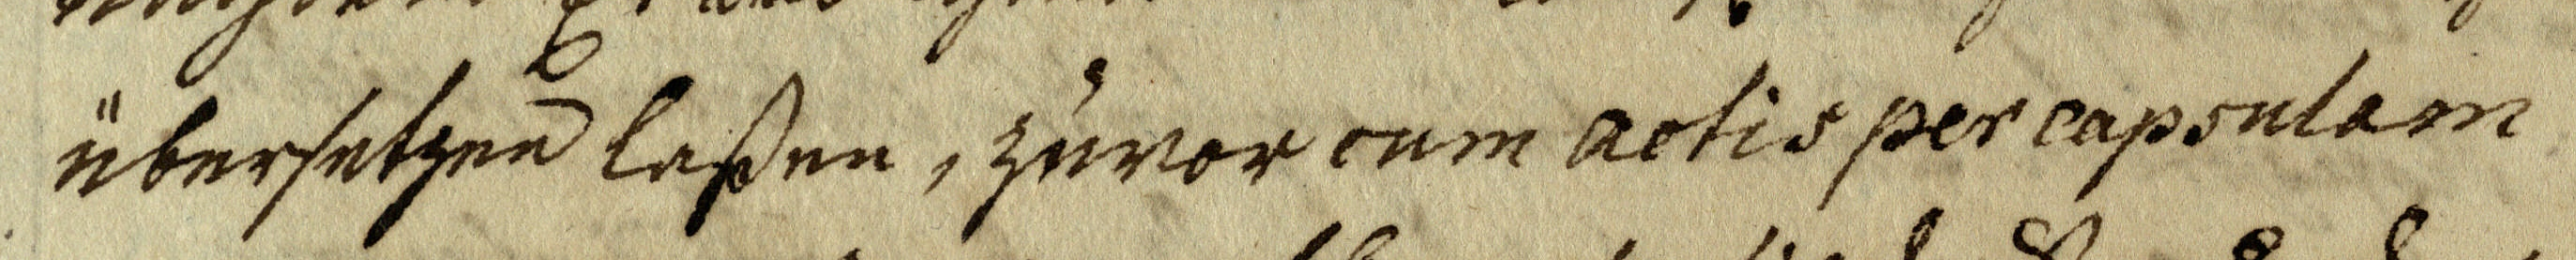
übersetzen laßen, zuvor cum actis per capsulam
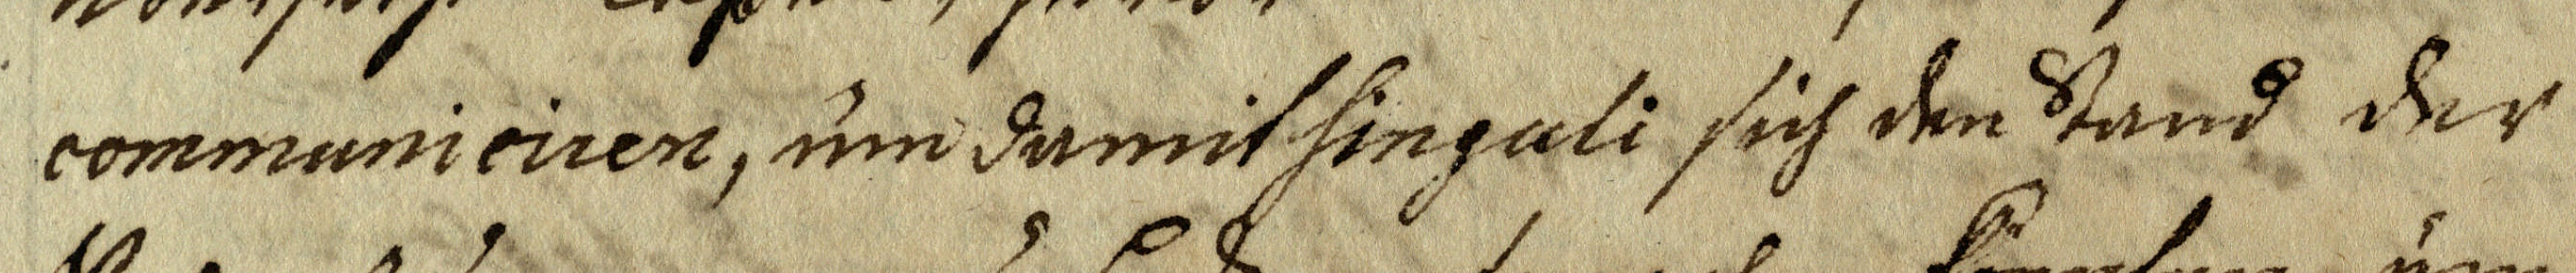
communiciren, um damit singuli sich den Stand der
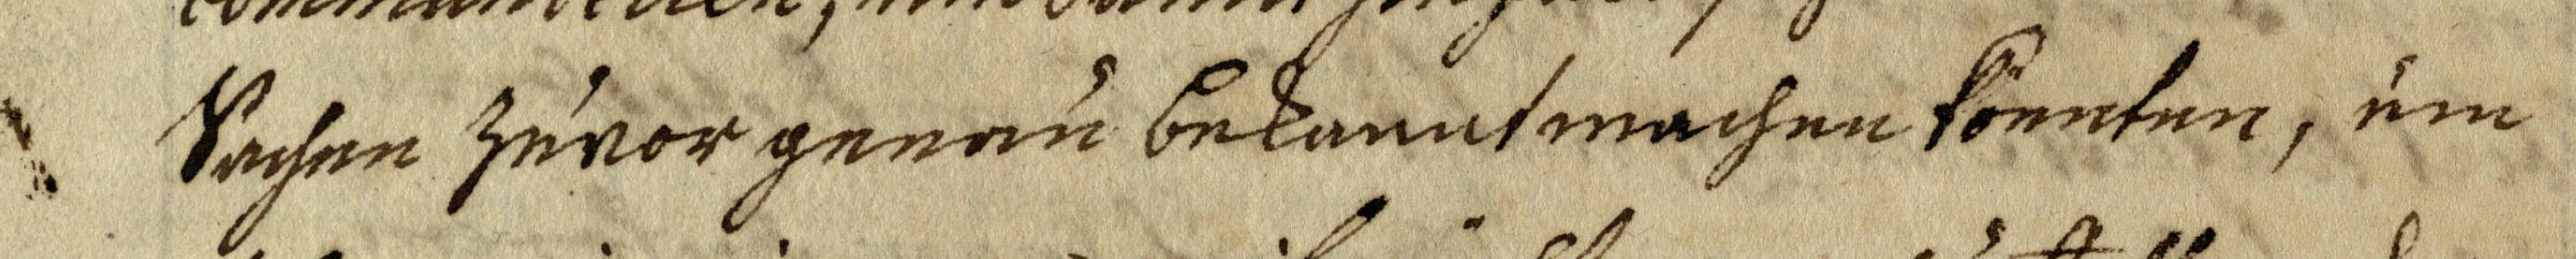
Sachen zuvor genau bekanntmachen könnten, um
